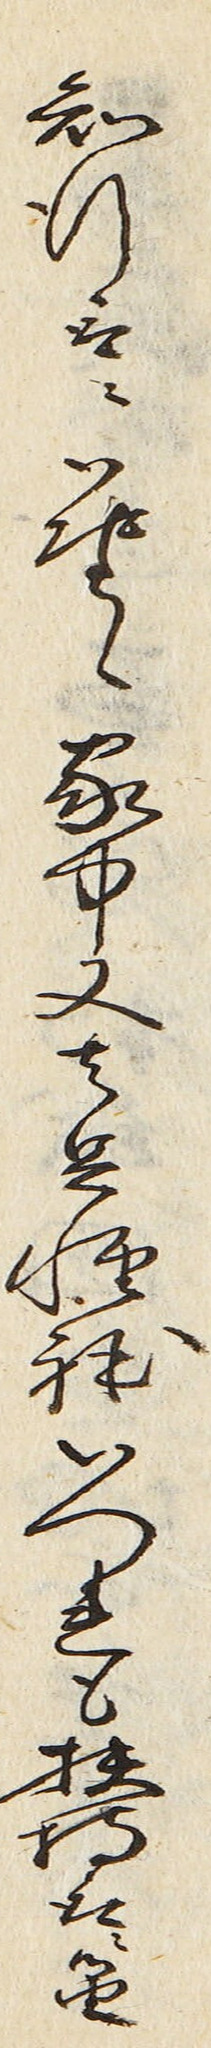知行取に御坐候家中又は足軽躰いつれも扶持取に候由
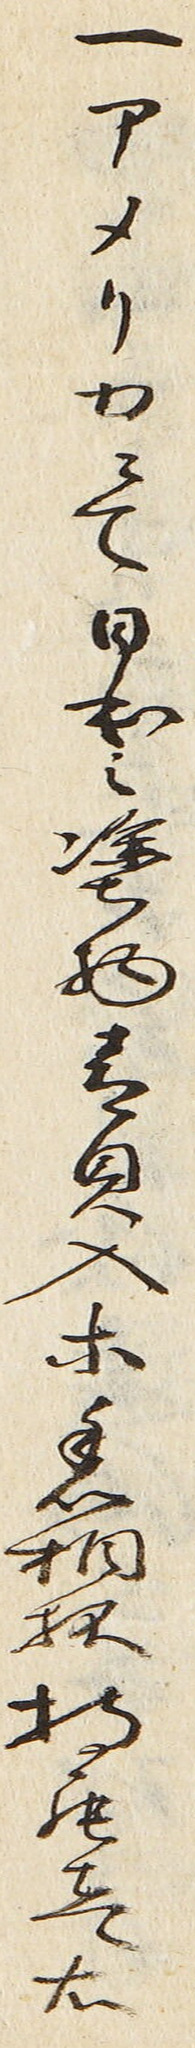一アメリカにて日本之塗物青貝入等手箱抔持罷在候右
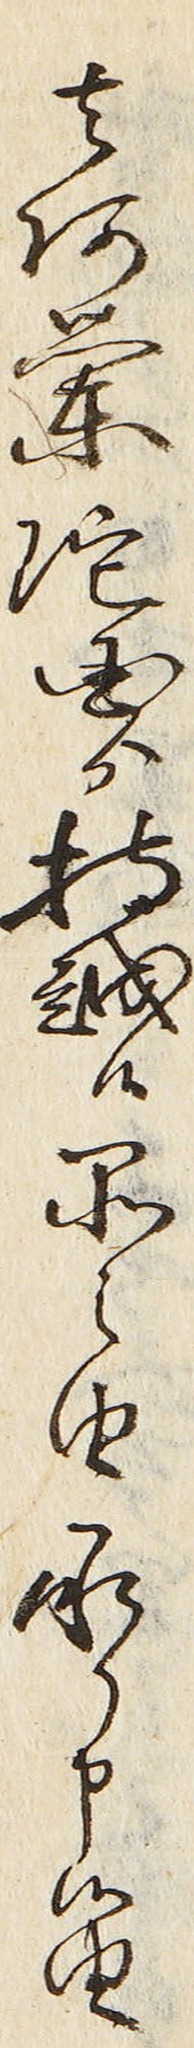は阿蘭陀国ゟ持越候品之由承り申候由
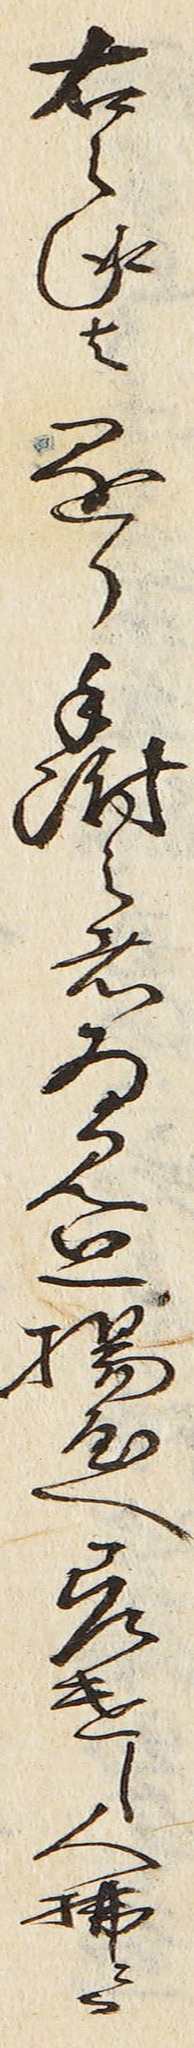右之趣は懸り手附之者為見廻揚屋へ差遣し人払に而
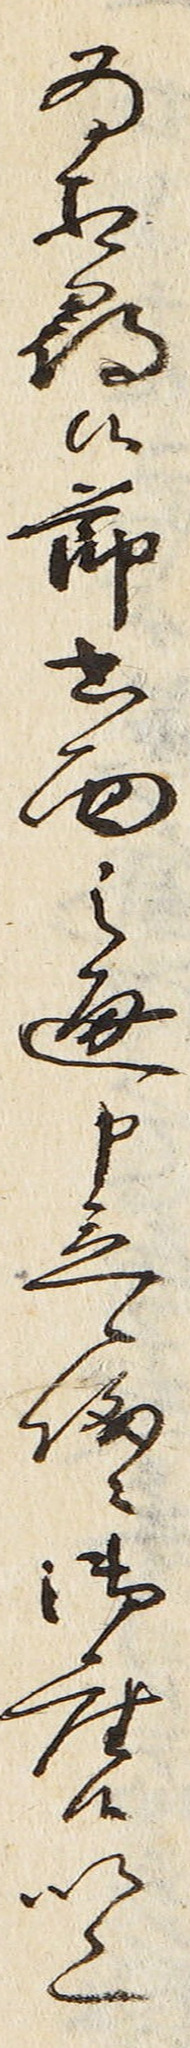為相尋候節書面之通申立候儀に御座候已上
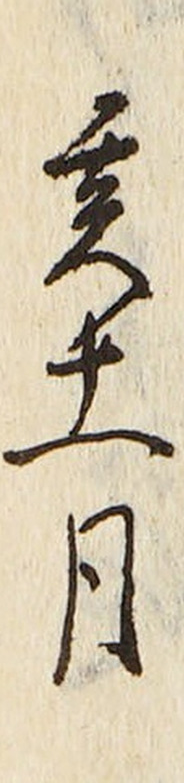亥十一月
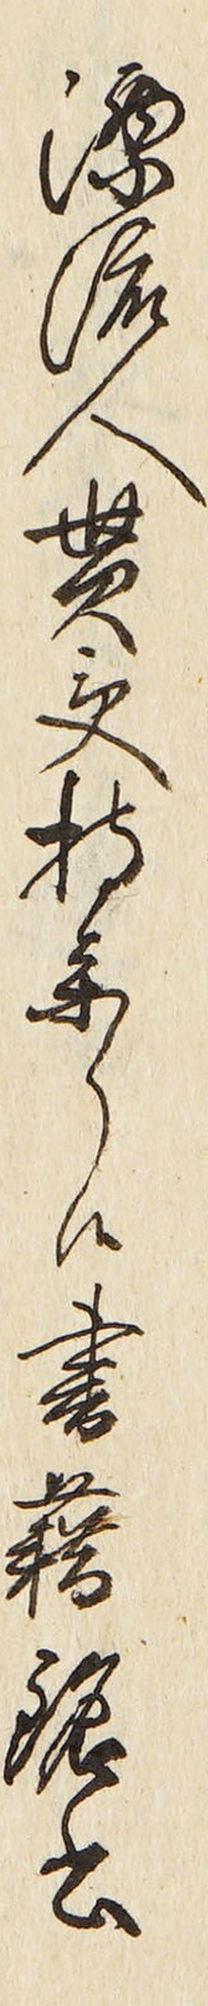漂流人貰受持参り候書籍銘書
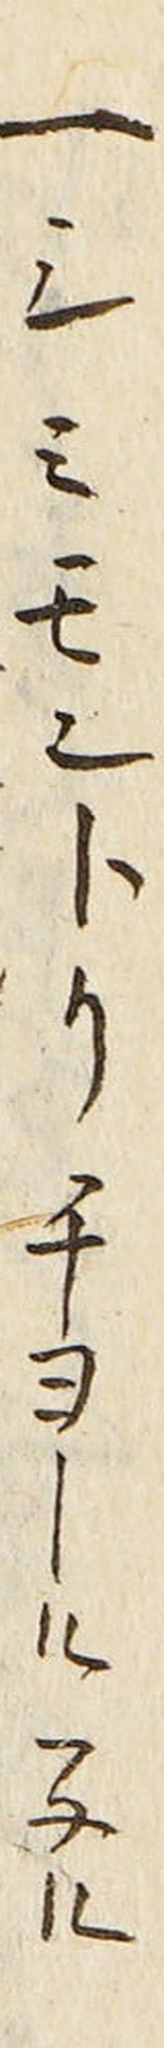一シミモントリチヨールネル
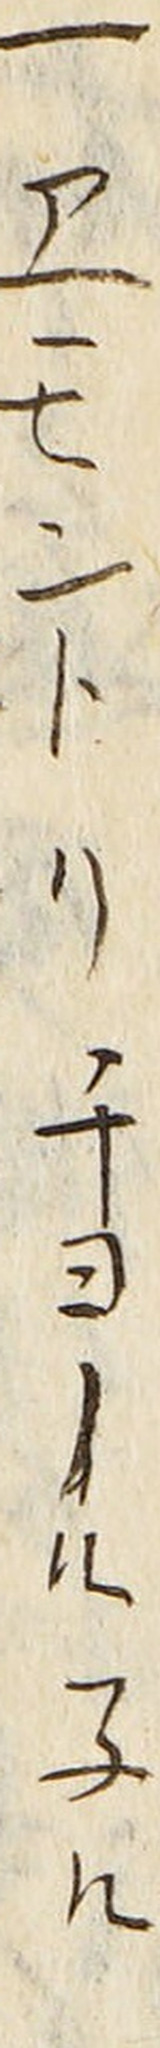一エモントリチヨールネル
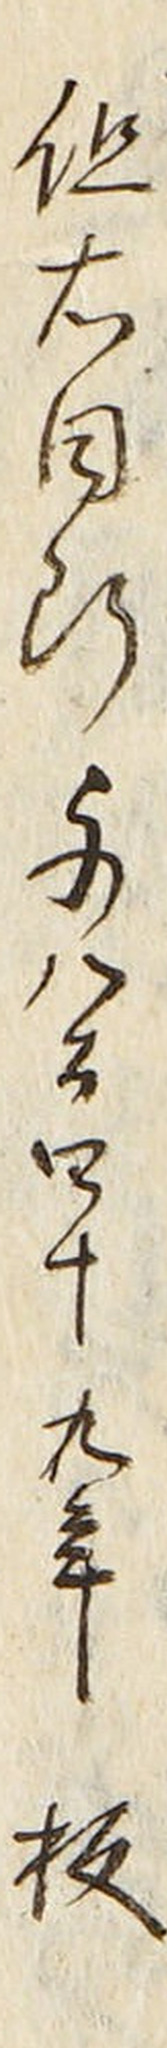但右同断千八百四十九年板一冊
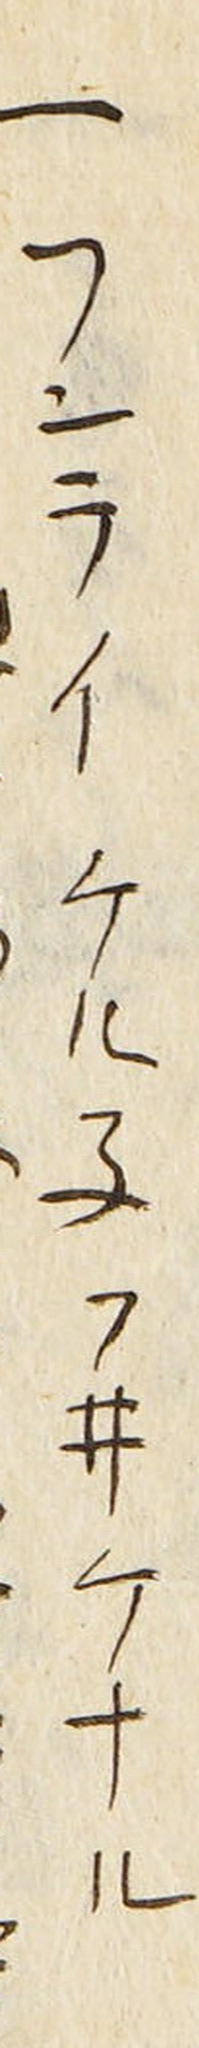一フンライケルネフヰケナル
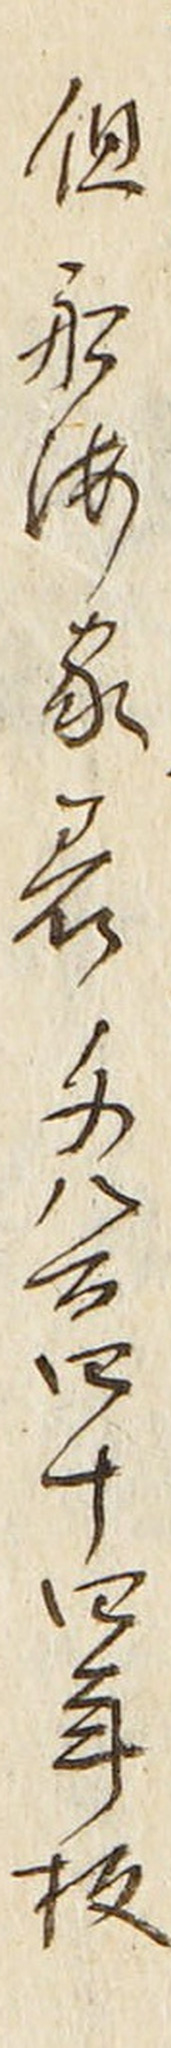但船海家表千八百四十四年板一冊
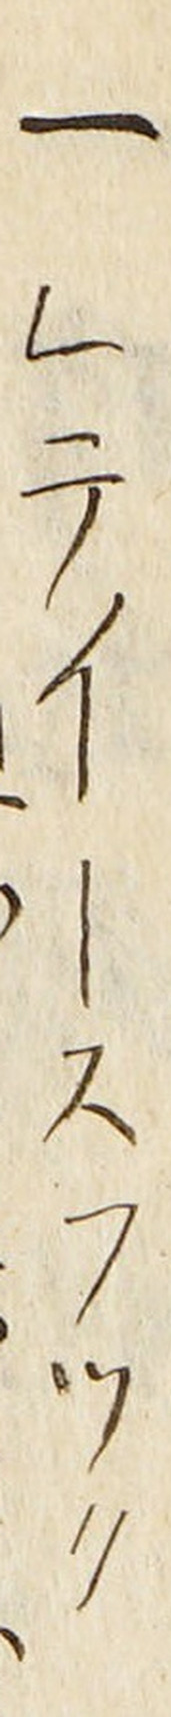一レテイースフツク
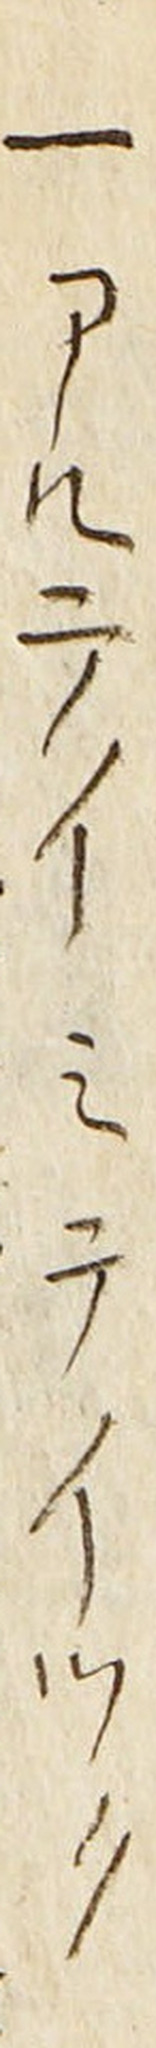一アルテイミテイツク
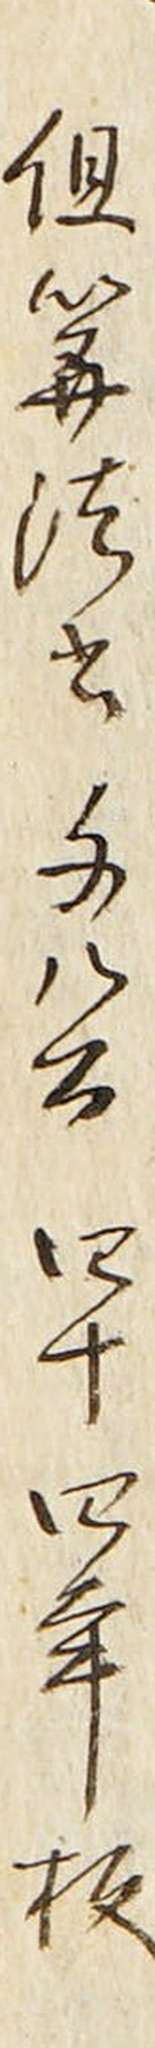但算法書千八百四十四年板一冊
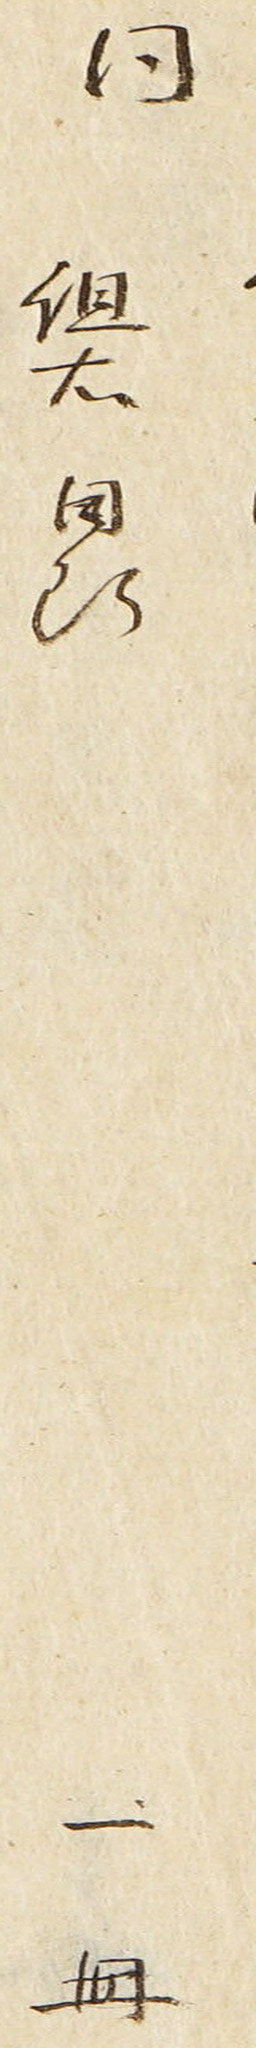一同但右同断一冊
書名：土佐中浜万次郎漂流記
